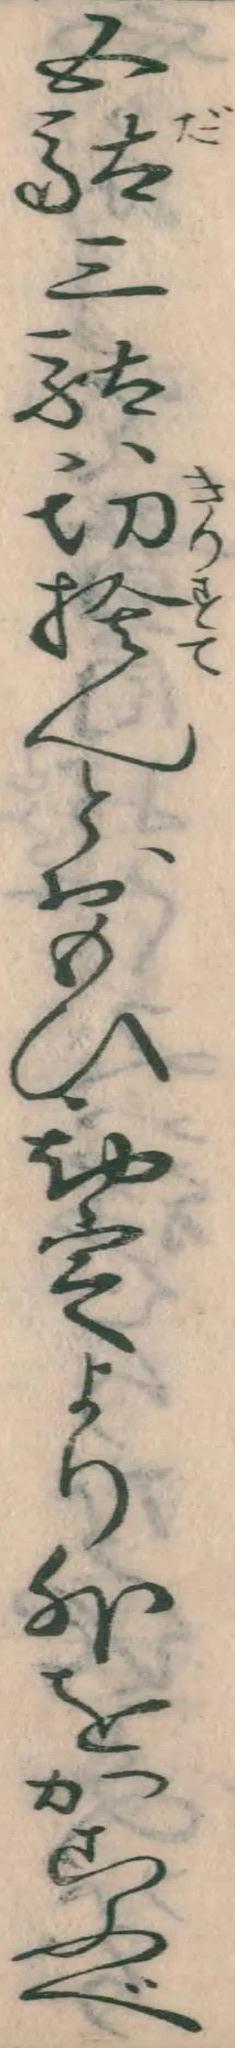五駄三駄は切捨んとおもひ勘定より外をかこふべ
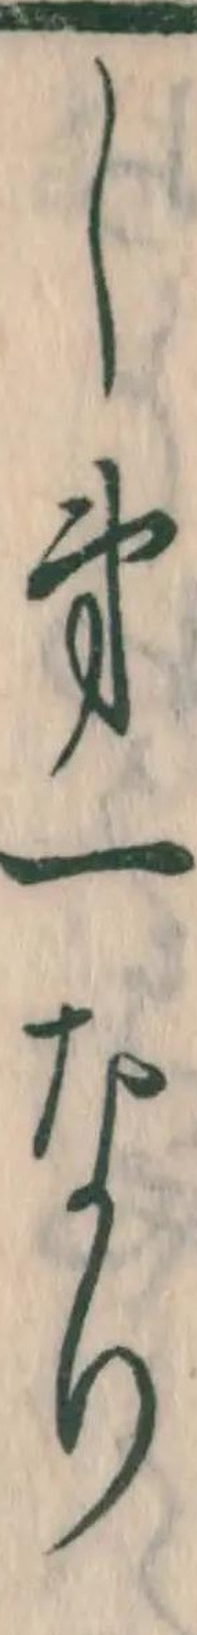し第一なり
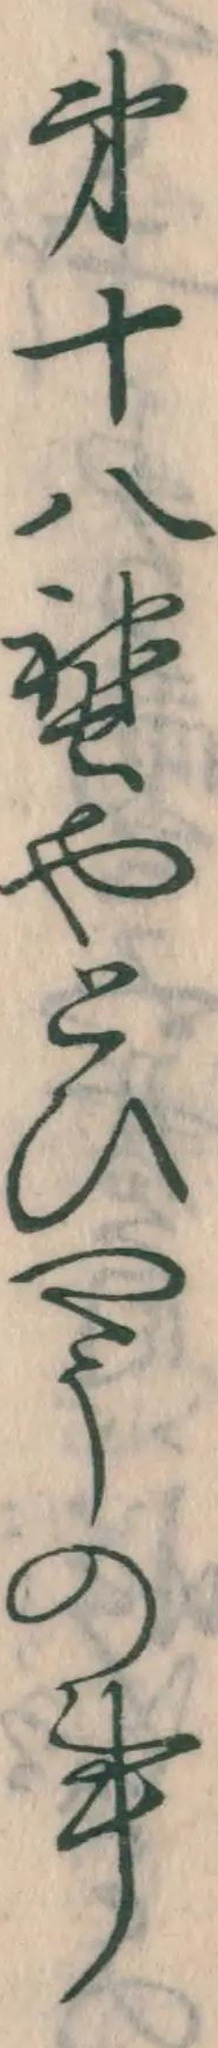第十八䗝やとひやうの事
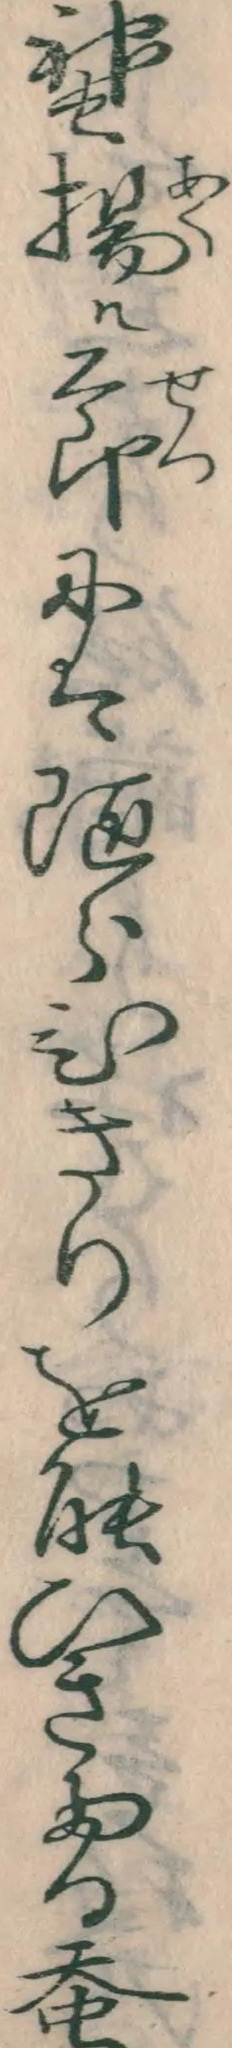䗝揚る節には随分ひきりを能ひきたる蚕
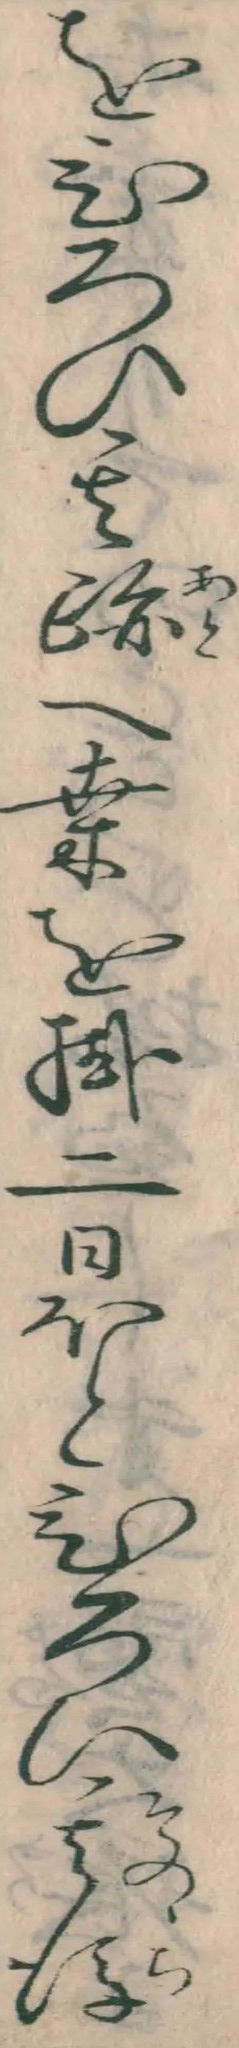をひろひ其跡へ桑を掛二日ほとひろひ其後

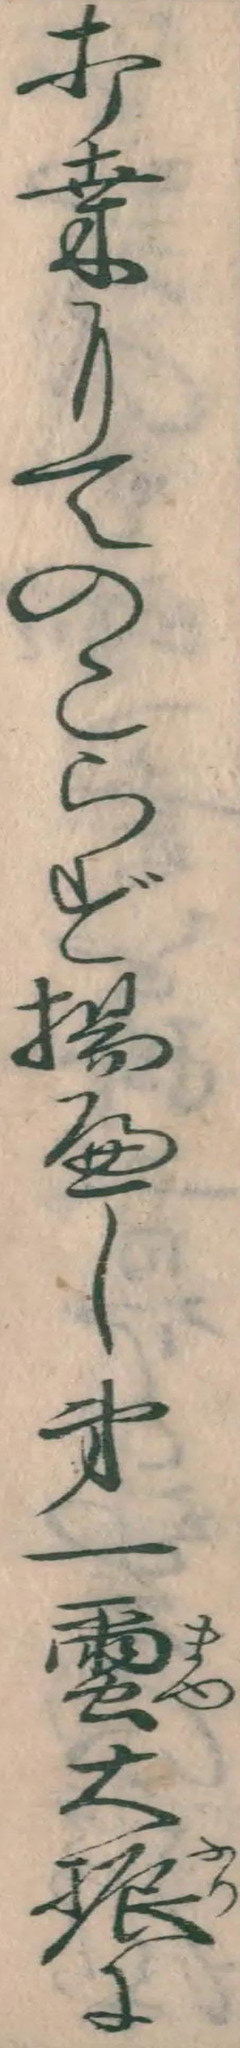打桑にてのこらず揚へし第一繭大振に
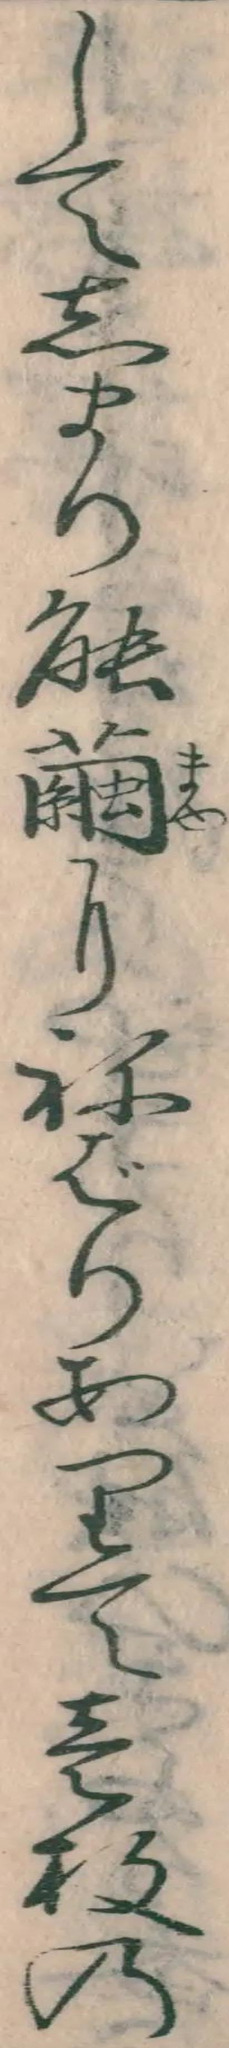してしまり能繭にねばりありて壱枚の
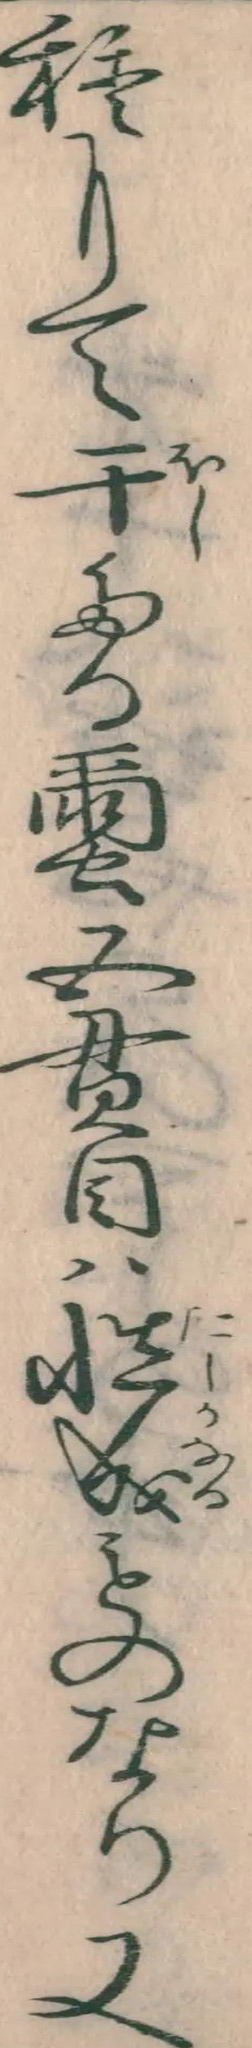種にて干たる繭五貫目は慥成ものなり又
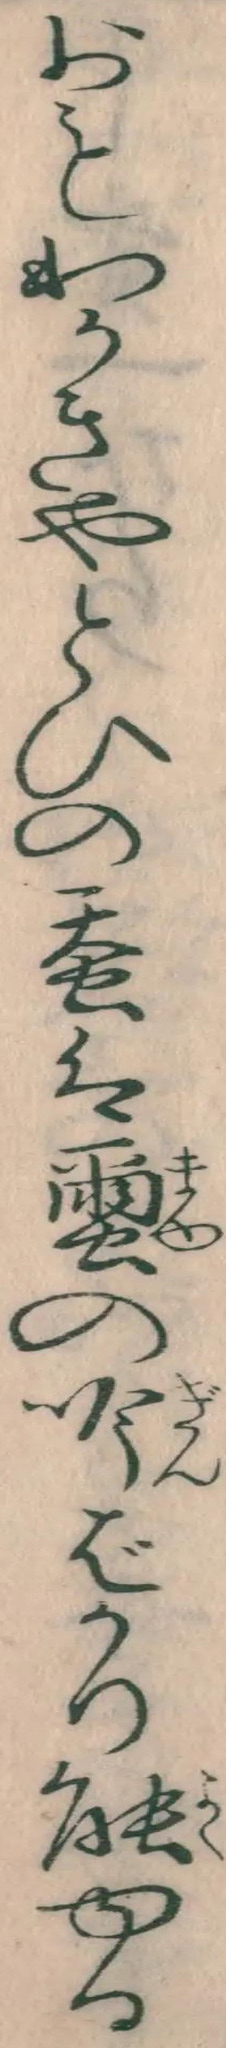少もわかきやとひの蚕は繭の吟ばかり能ゆる
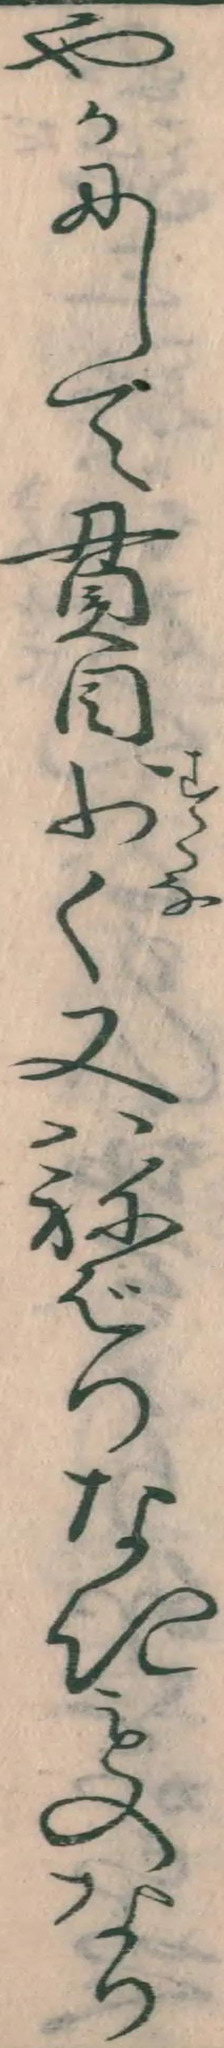やかにして貫目少く又はねばりなきものなり
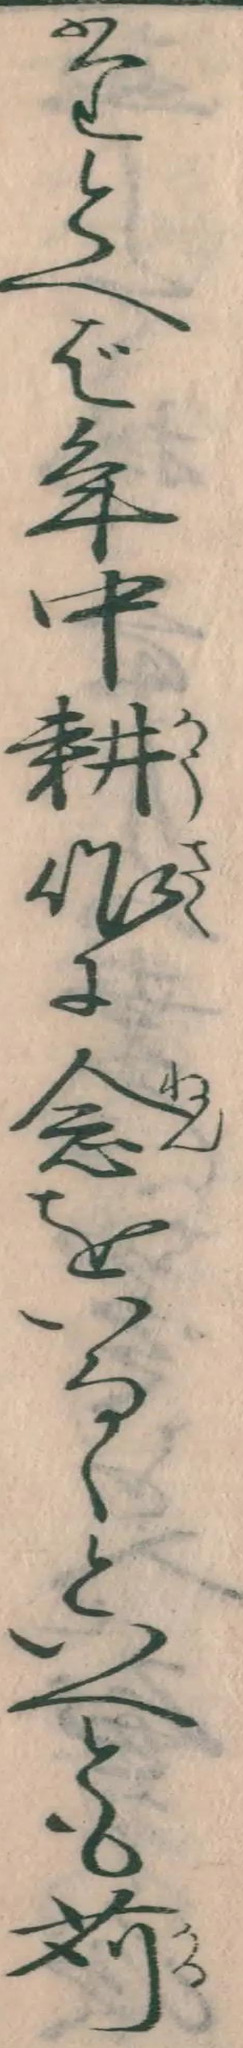たとへば年中耕作に念をいるゝといへとも苅
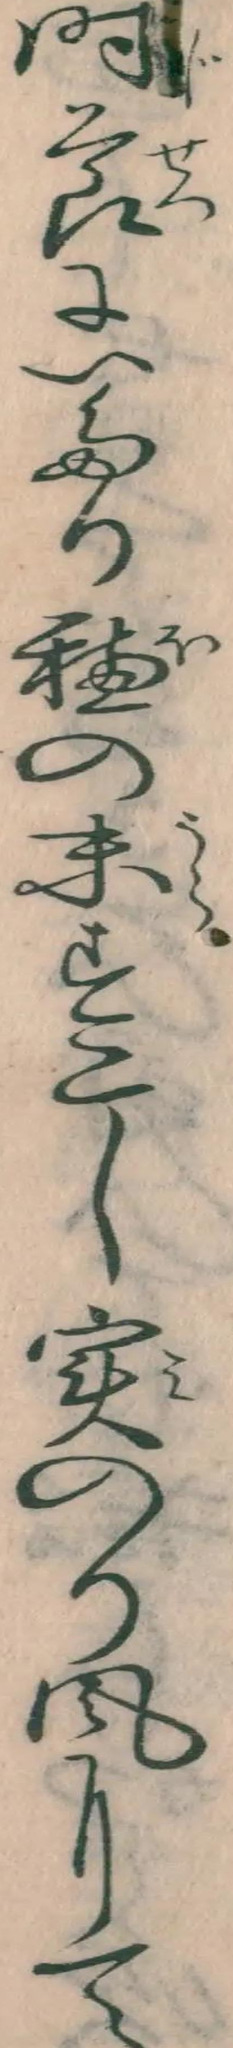時節にいたり穂の末すこし実のり風にて
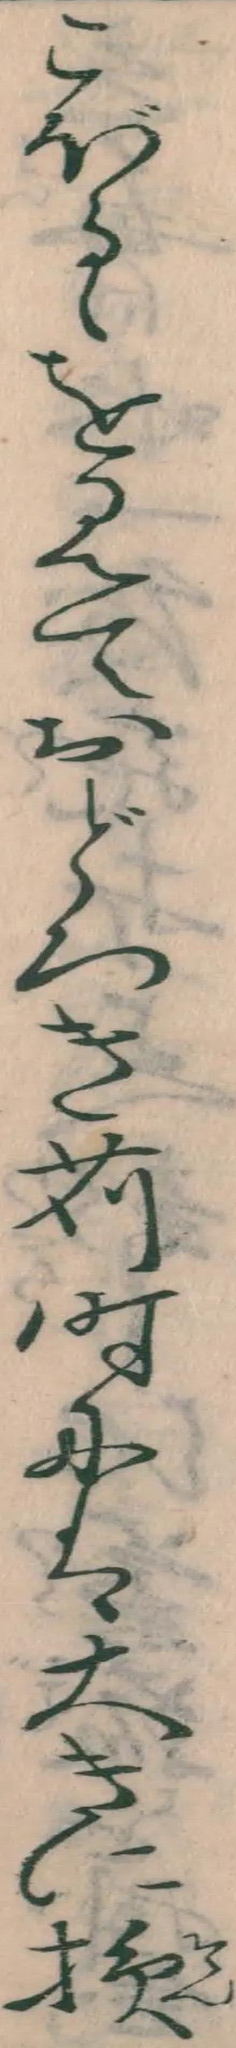こぼるゝを見ておどろき苅時には大きに損
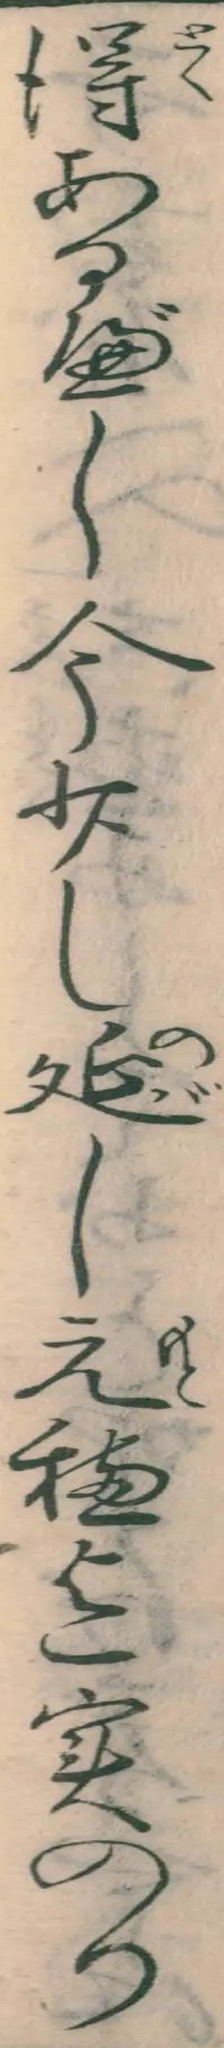得あるべし今少し延し元穂迄実のり
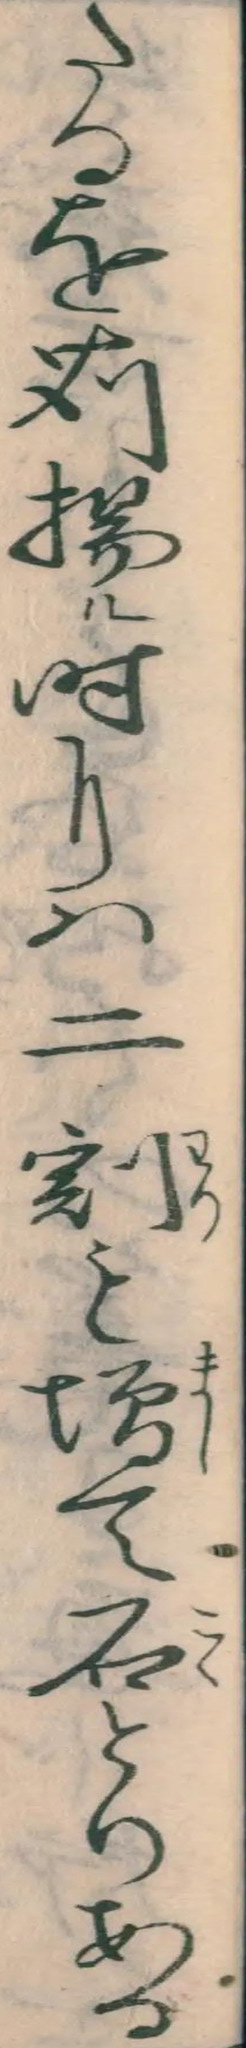たるを苅揚る時には二割も増て石とりある
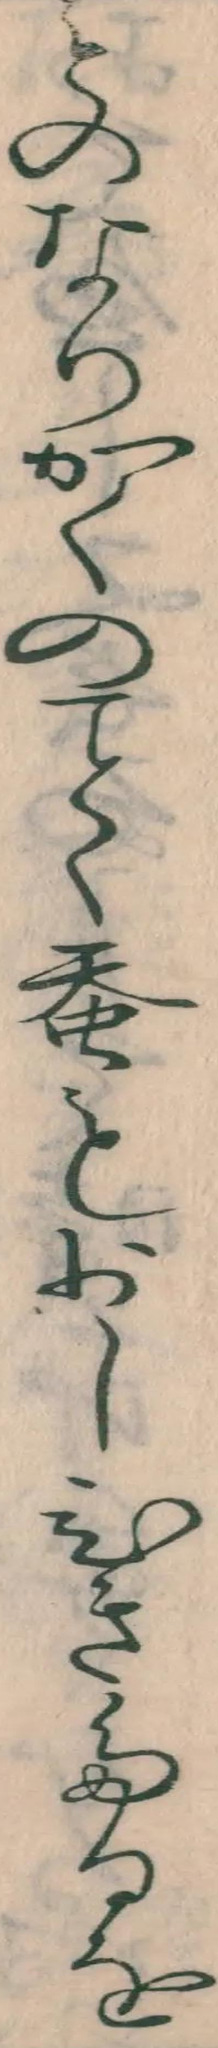ものなりかくのことく蚕も少しひきたるを
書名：新撰養蚕秘書
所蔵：国立国会図書館 National Diet Library, JAPAN
